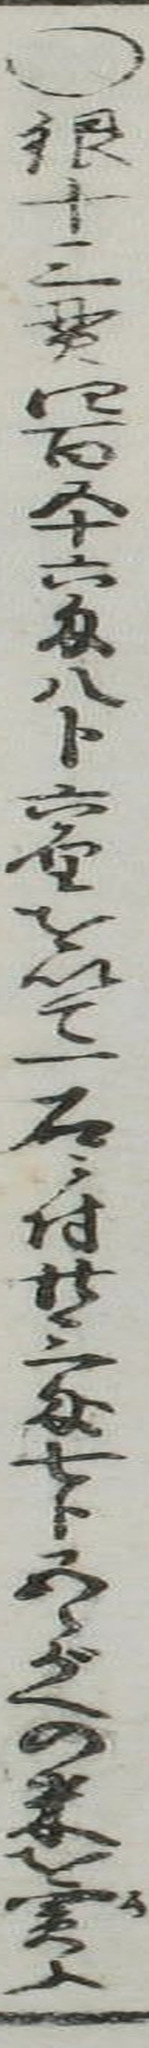○銀十三貫四百五十六匁八分六厘を以て一石に付廿三匁七分五厘がへの米を買ふ
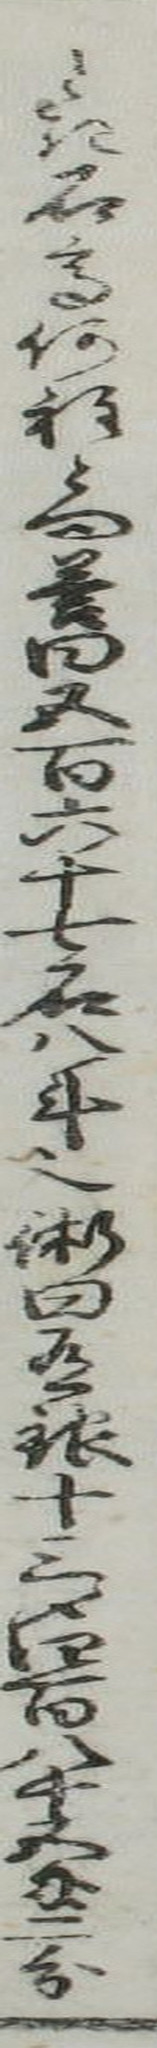とき石高何程と問答曰五百六十七石八斗也術曰有銀十三貫四百八十五匁二分
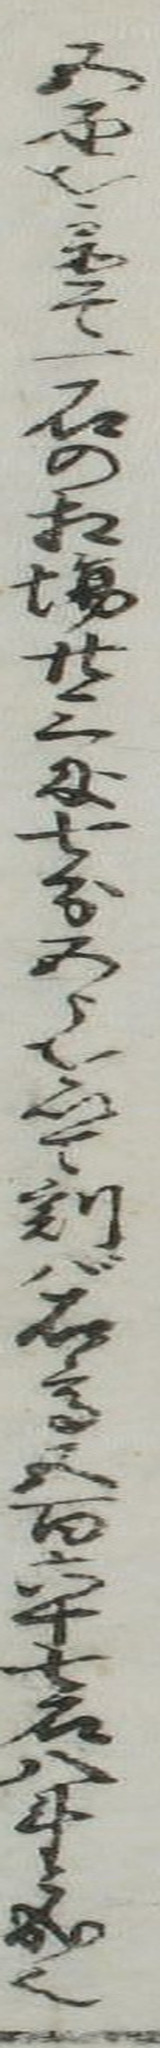五厘を置て一石の相場廿三匁七分五厘を以て割ば石高五百六十七石八斗と成也

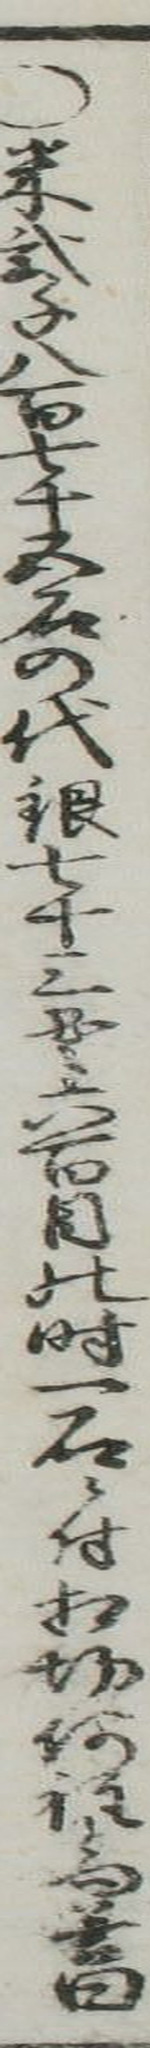○米弐千八百七十五石の代銀七十三貫六百目の時一石に付相場何程と問答曰
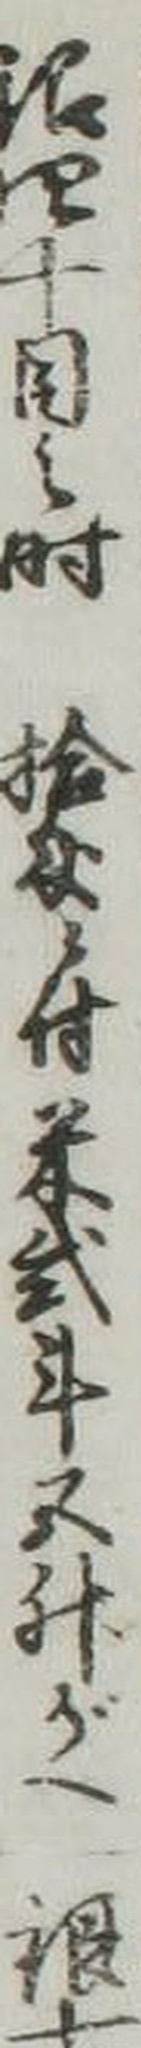銀四十目の時拾匁に付米弐斗五升がへ
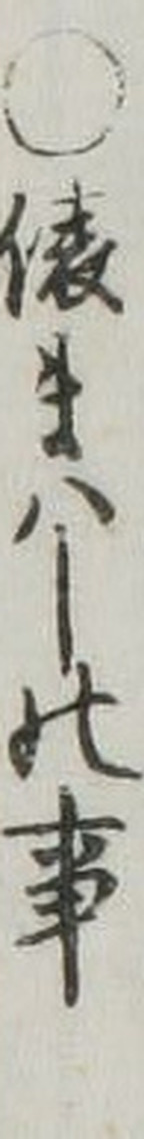○俵まはしの事
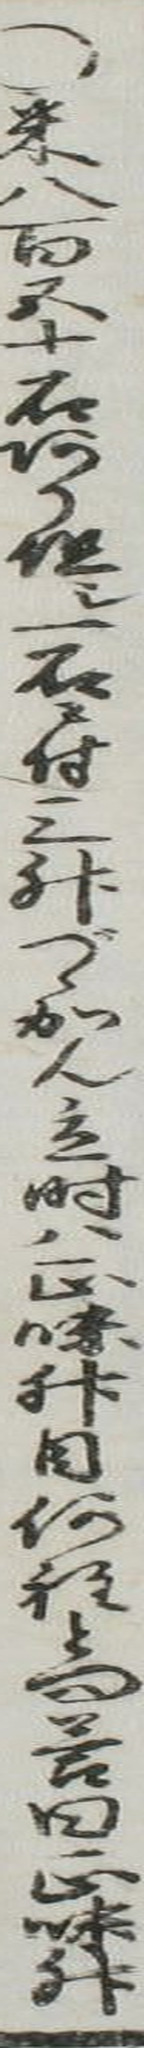○米八百五十石あり但し一石に付三升づゝかん立時は正味升目何程と問答曰正味升
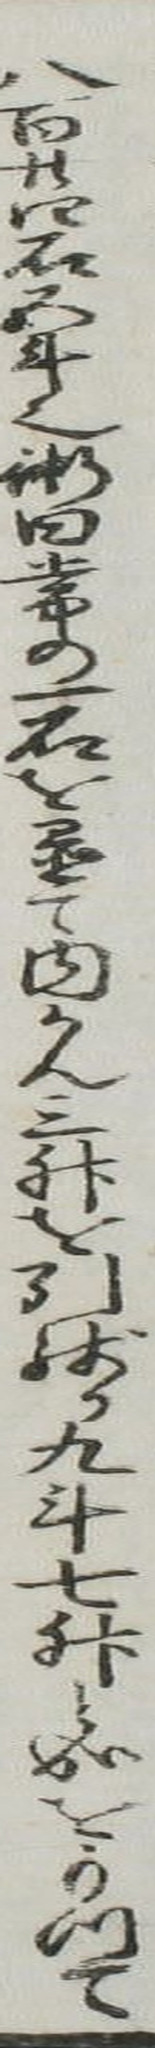八百廿四石五斗也術曰常の一石を置て内かん三升を引残り九斗七升と成をもつて
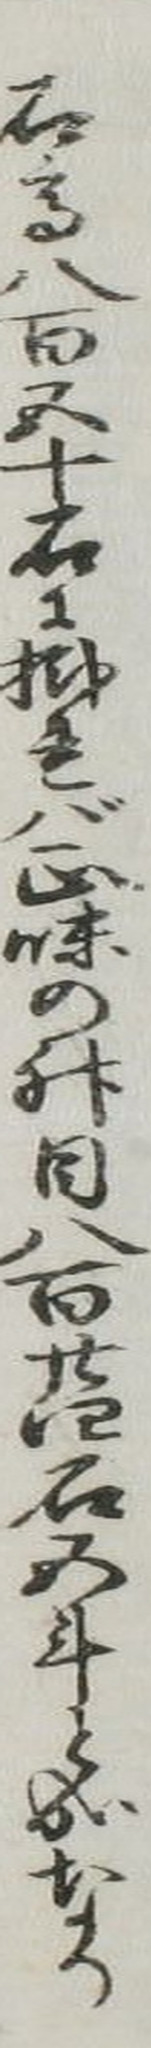石高八百五十石に掛れば正味の升目八百廿四石五斗と成なり
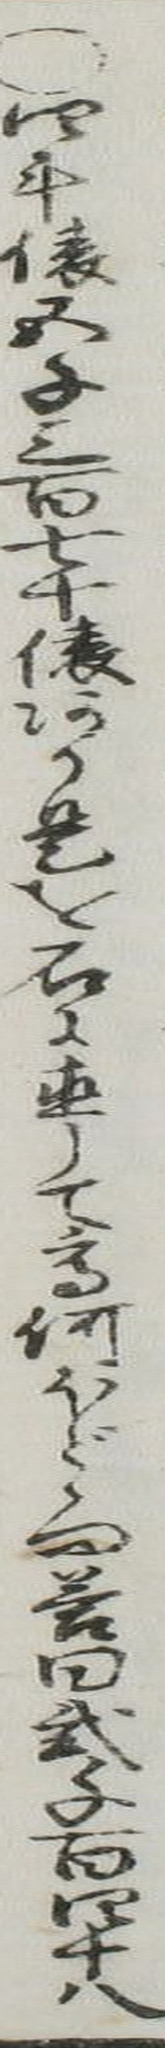○四斗俵五千三百七十俵あり是を石に直して高何ほどゝ問答曰弐千百四十八
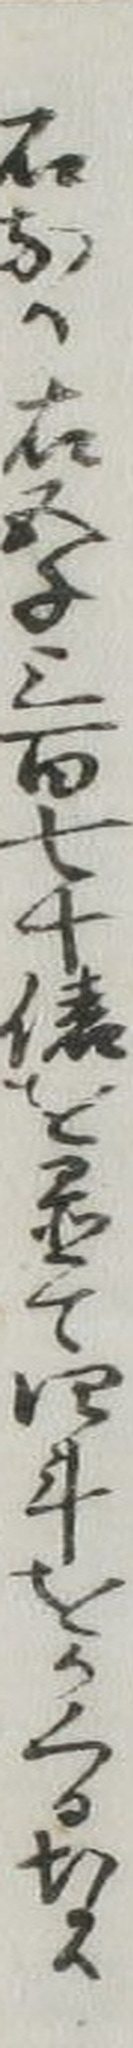石なり右五千三百七十俵を置て四斗をかくるなり
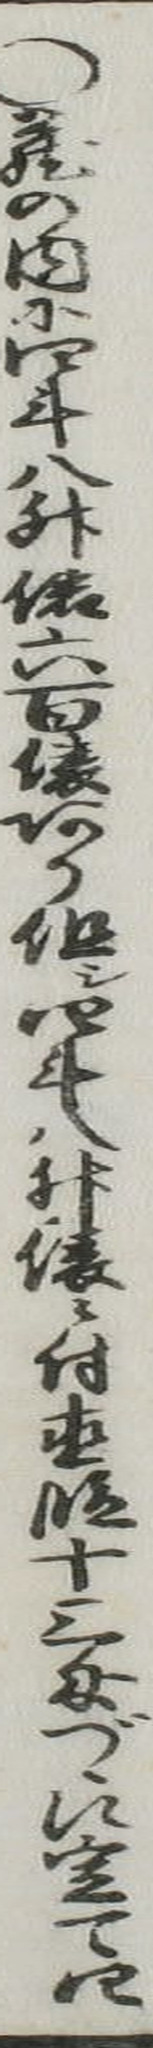○蔵の内に四斗八升俵六百俵あり但し四斗八升俵に付直段十三匁づゝに定て四
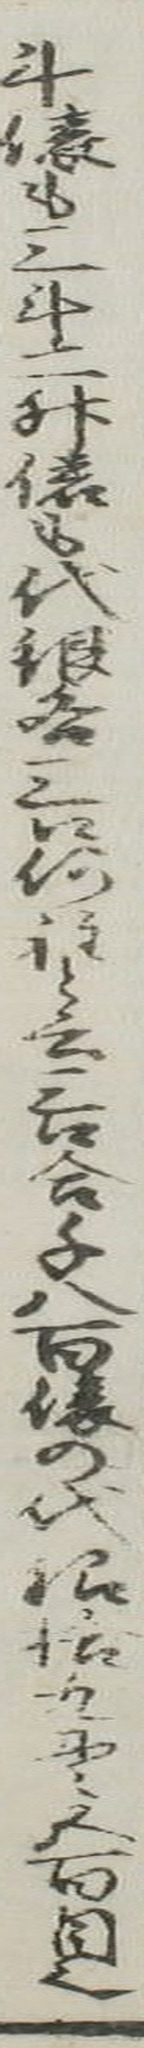斗俵も三斗二升俵も代銀各三口何程と云三口合千八百俵の代銀拾九貫五百目也
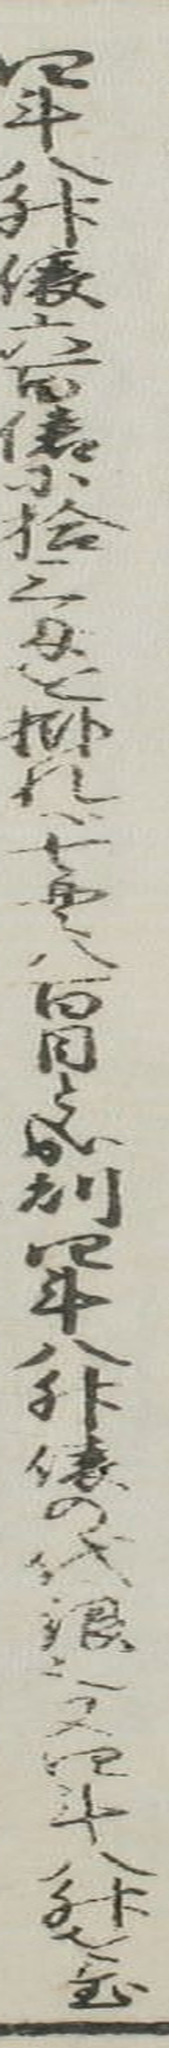四斗八升俵六百俵に拾三匁を掛れば七貫八百目と成刻四斗八升俵の代銀也又四斗八升を置
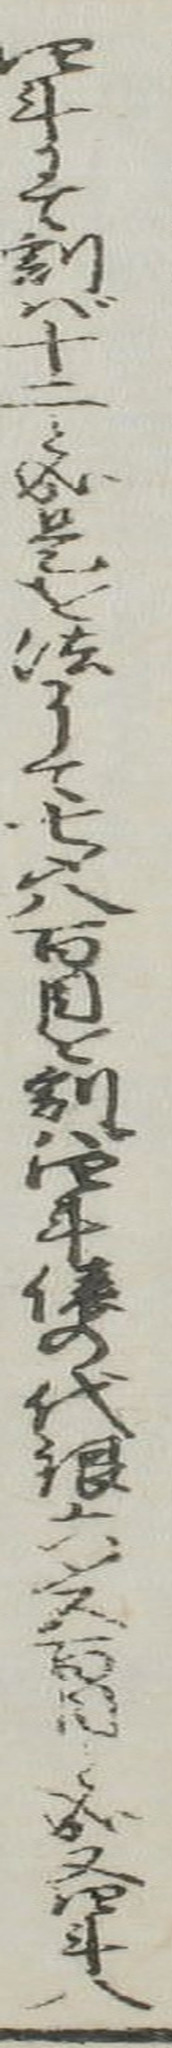四斗にて割ば十二と成是を法にして七貫八百目を割ば四斗俵の代銀六貫五百目と成又四斗八
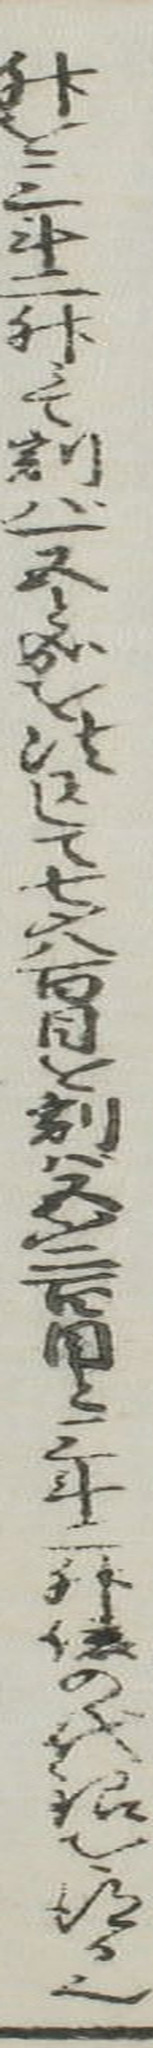升を三升二斗にて割ば一五と成を法にして七貫六百俵を割ば五貫二百目と三斗二升俵の代銀を得る也
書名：宝玉塵劫記
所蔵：東京学芸大学教育コンテンツアーカイブ
